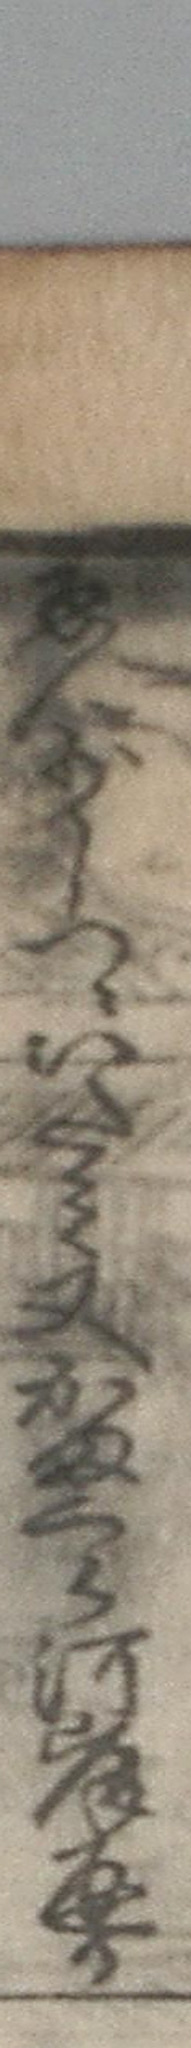ゑん少しつゝいたみ又かまくら河岸通り
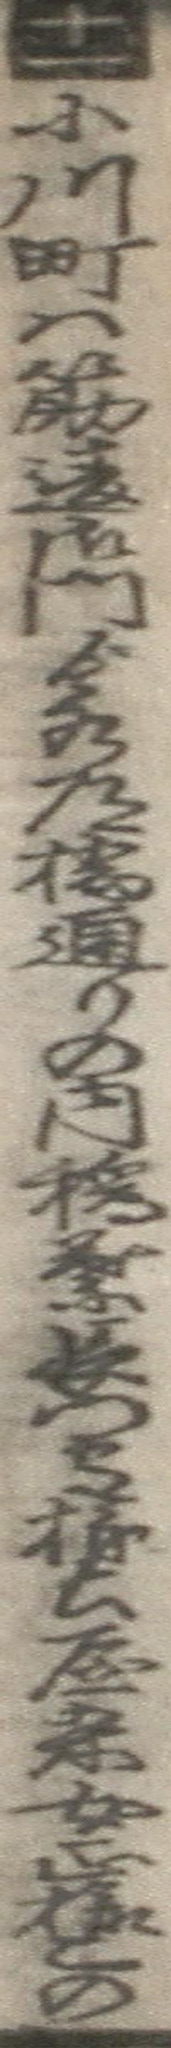十一小川町は筋違御門ゟ水道橋通りの内稲葉長門守様長屋采女正様この
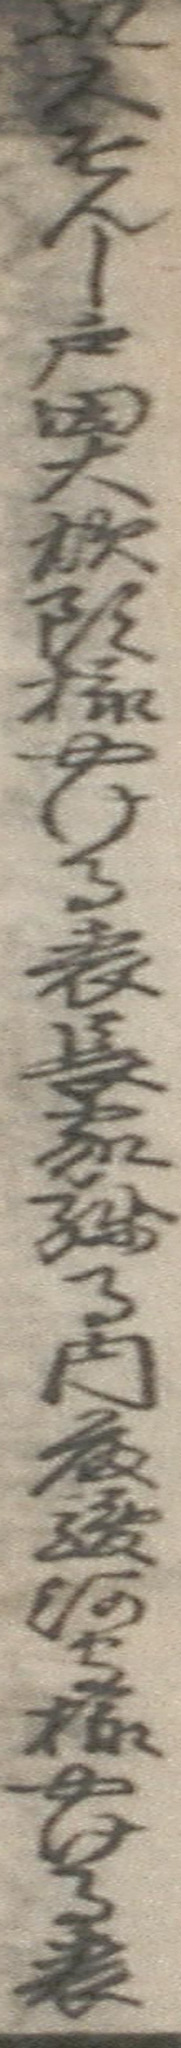辺大そんし戸田大炊頭様やける御表長家残る内藤駿河守様やける表
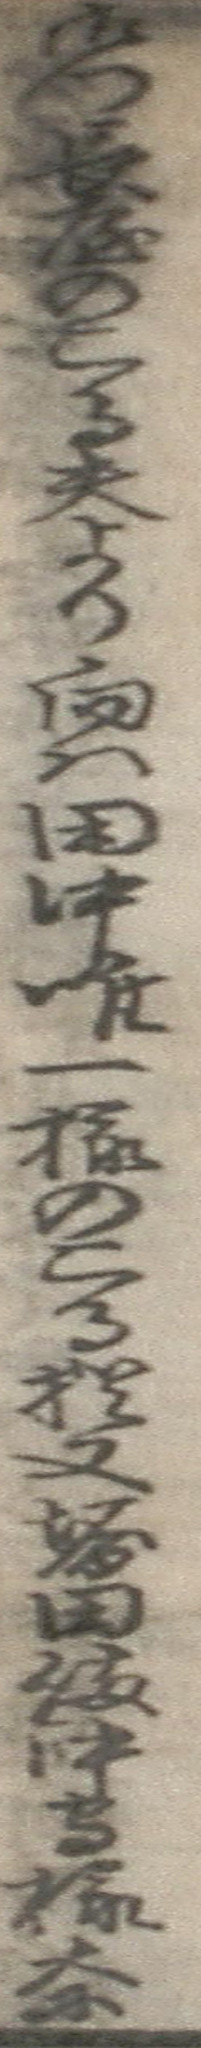御門長屋のこる夫より向は田中唯一様のこる猶又堀田備中守様大に
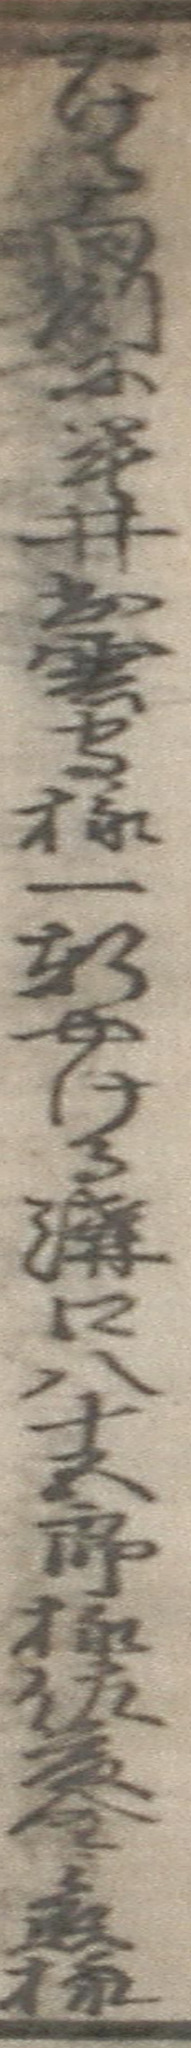やける向側に半井出雲守様一軒やける溝口八十五郎様佐藤金之丞様
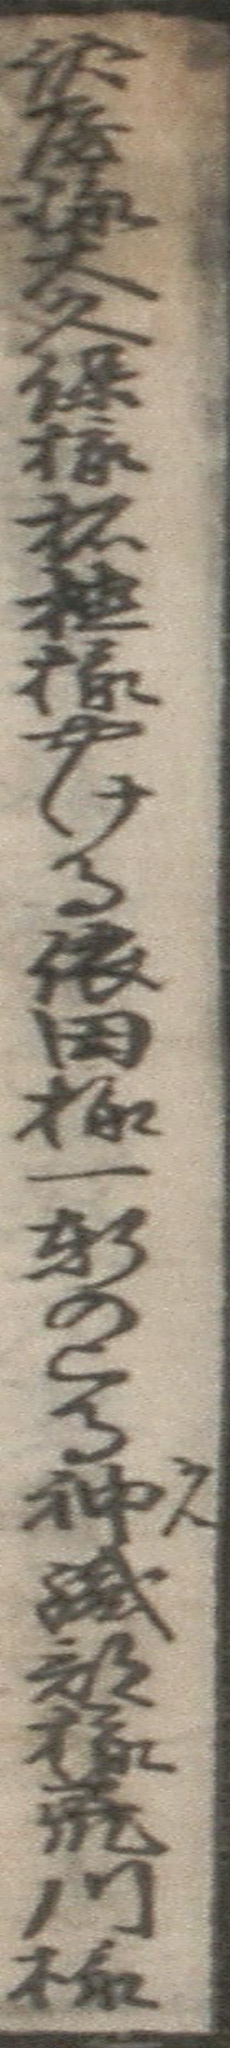伏屋様大久保様柘植様やける依田様一軒のこる神織部様荒川様
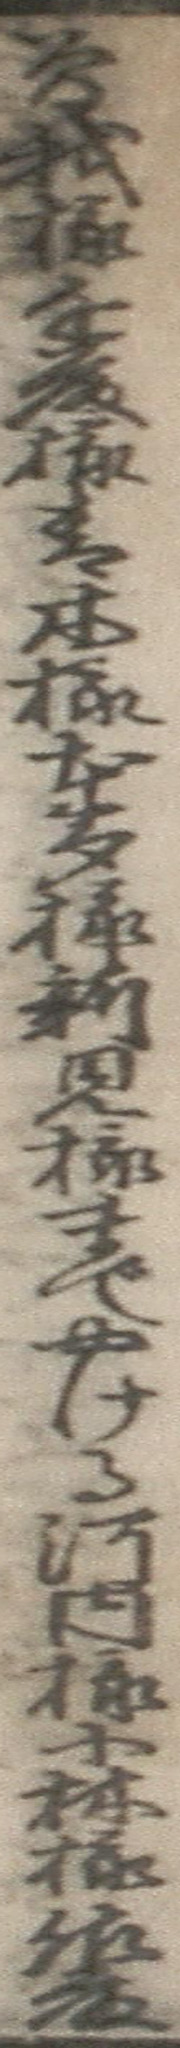曽我様近藤様青木様本多様新見様までやける河内様小林様佐藤
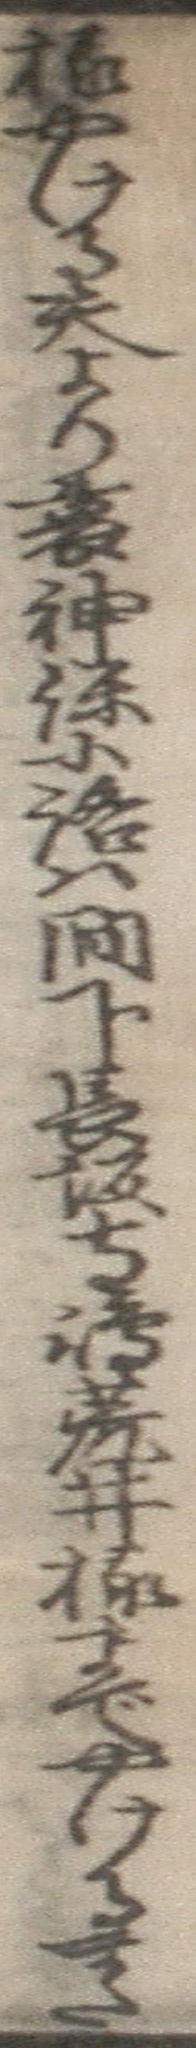様やける夫より裏神保小路は間下長坂寺嶋荒井様までやけるまた
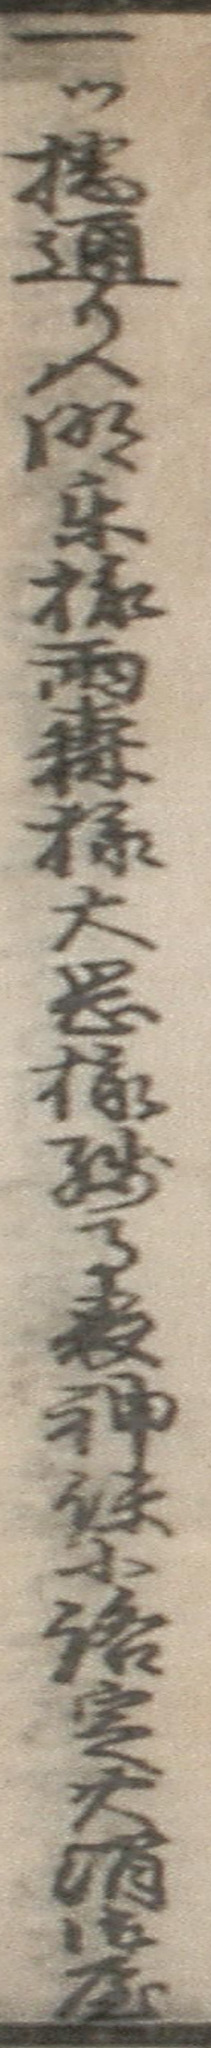一ツ橋通りは明楽様雨森様大岡残る表神保小路定火消御屋
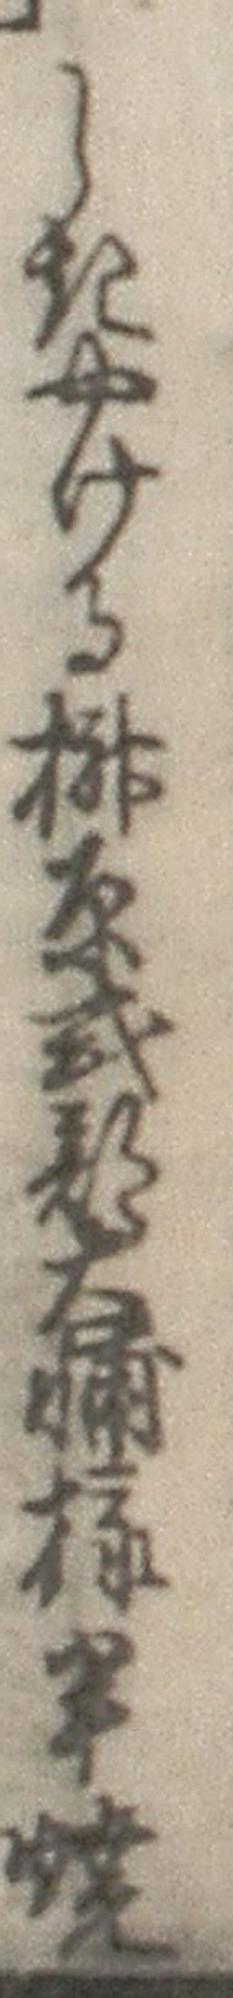しきやける榊原式部大輔様半焼
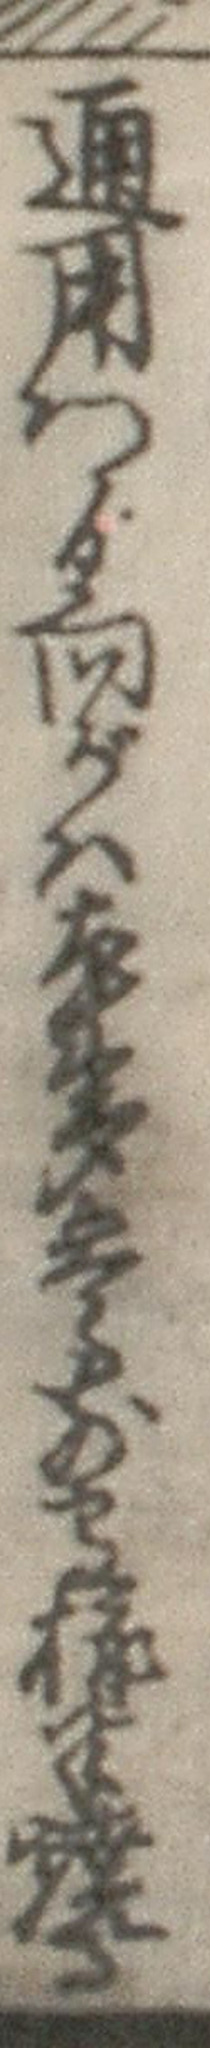通用門ゟ向がは本多豊前守様半焼る
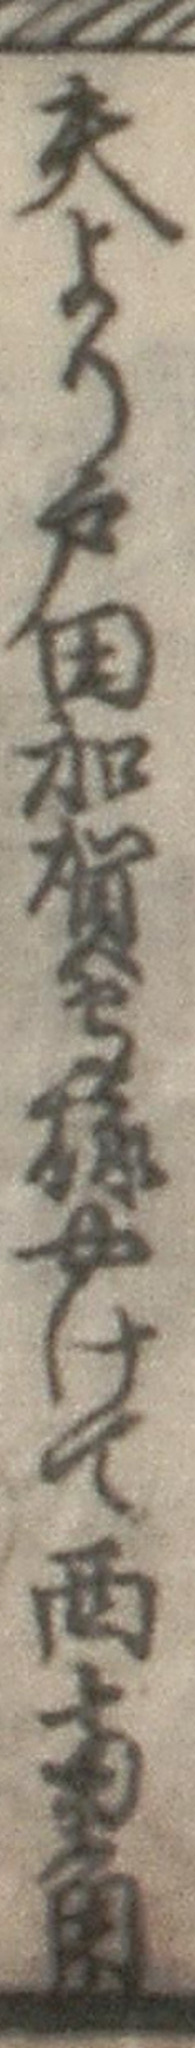夫より戸田加賀守様やけて西南角
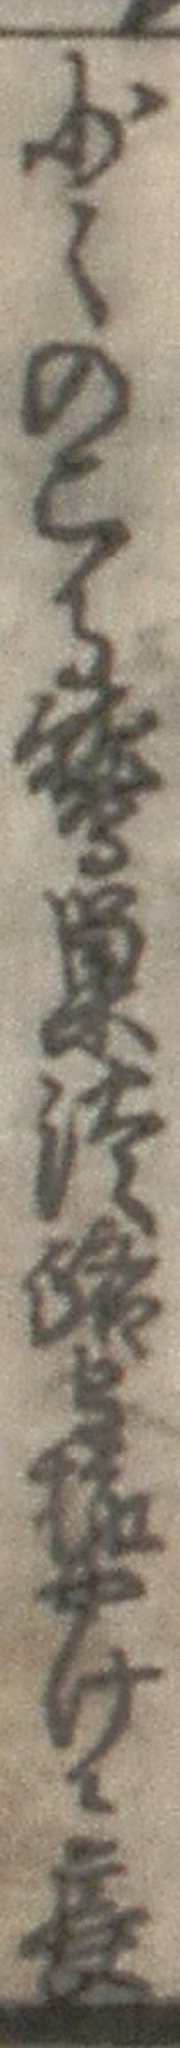少〻のこる鷲巣淡路守様やける長
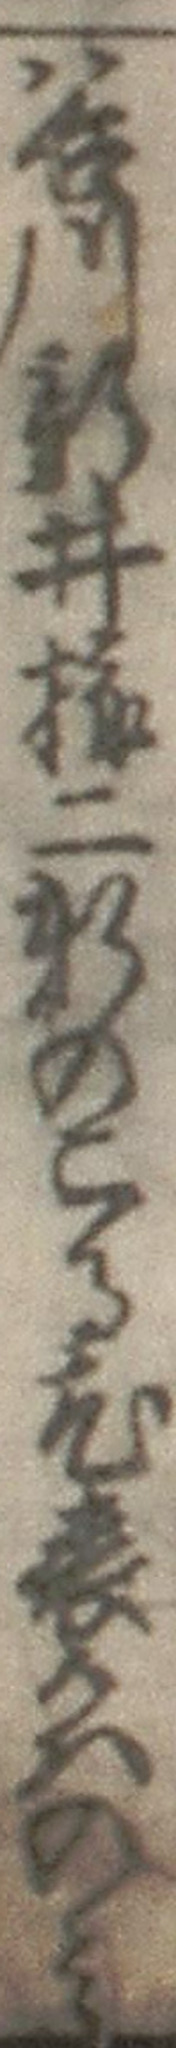谷川新井様二軒のこる尤表かはのみ
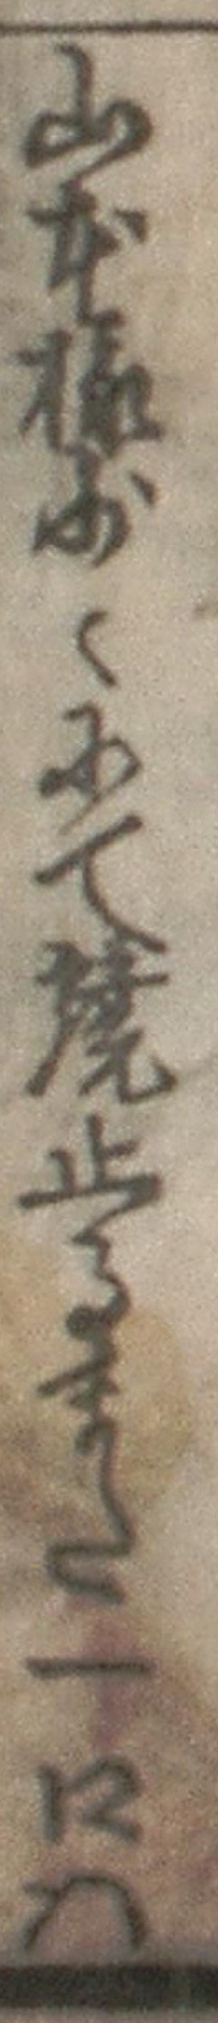山本様少〻にて焼止るまた一口は

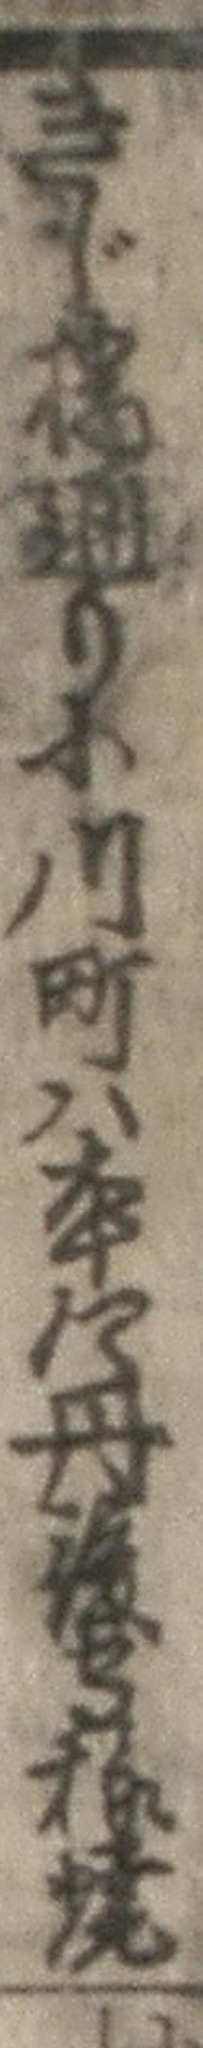きじ橋通り小川町は本郷丹後守様焼
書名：江戸大地震末代鑑
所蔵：東京大学地震研究所図書室 Earthquake Research Institute Library, The University of Tokyo, JAPAN
